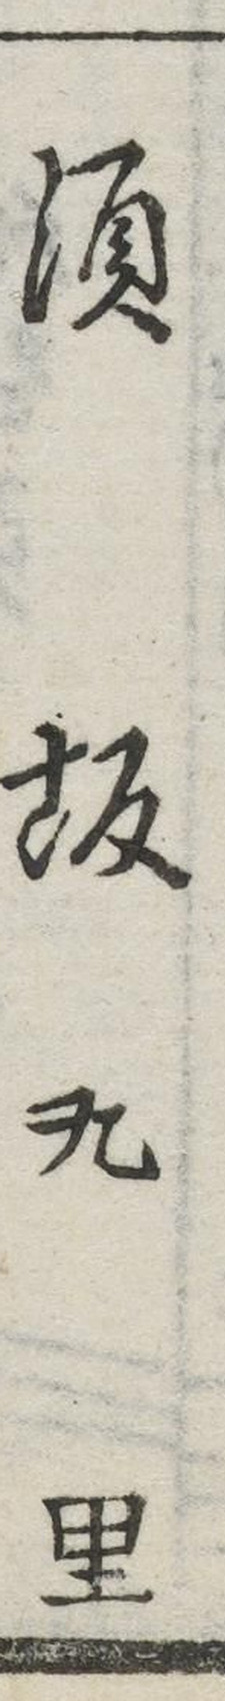須坂九里
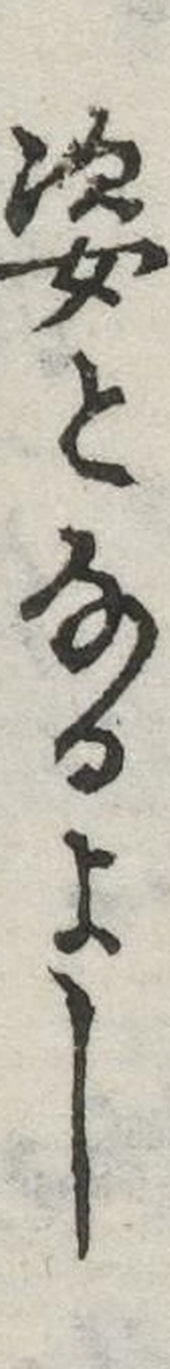姿となるよし
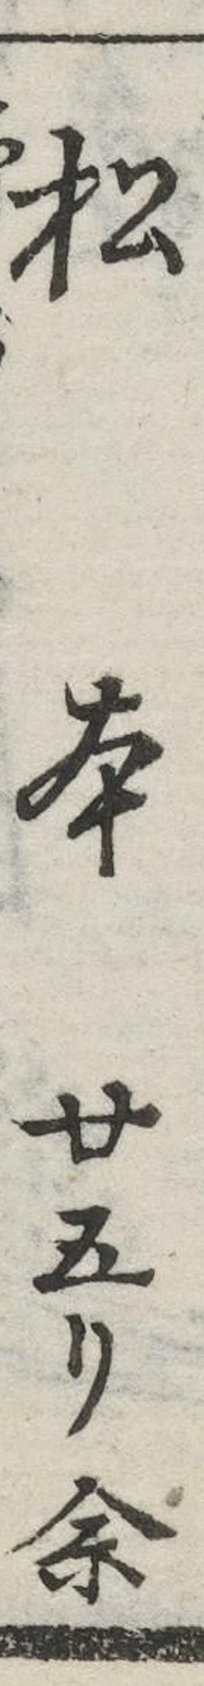松本廿五リ余
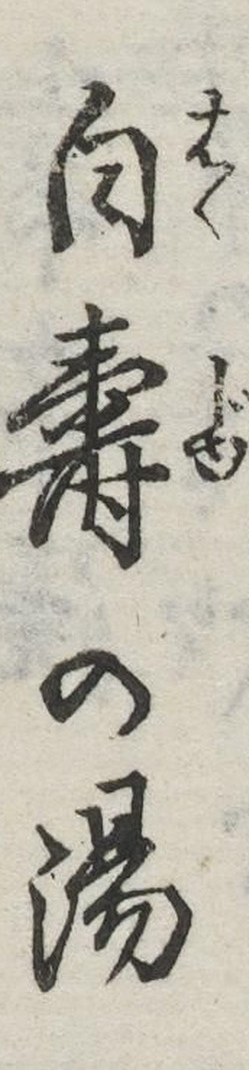白寿の湯
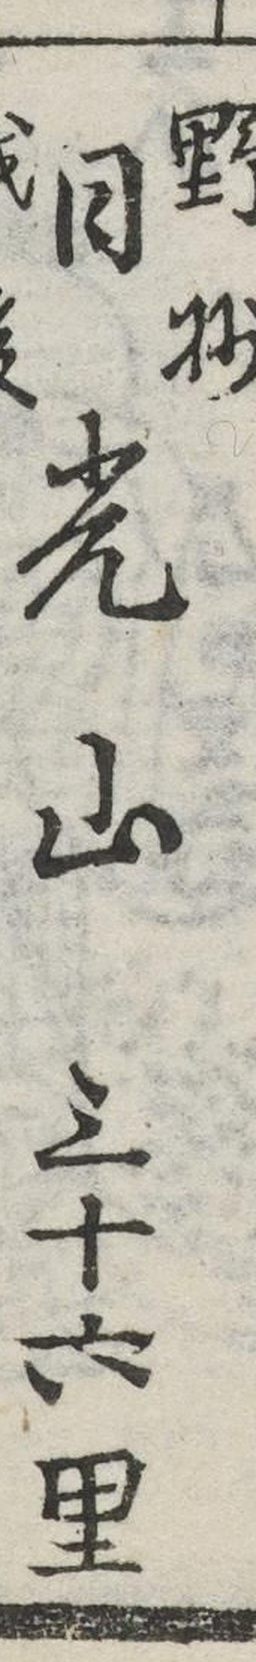日光山三十六里
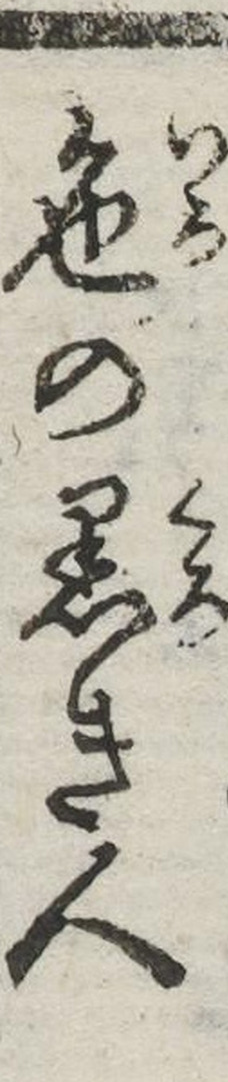色の黒き人
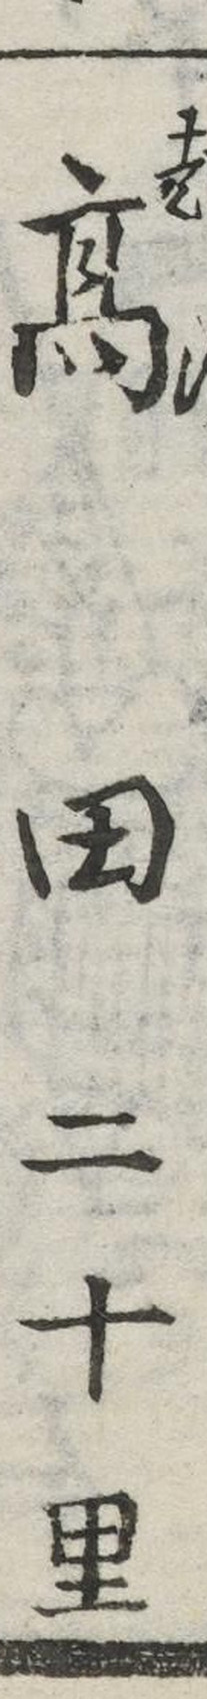高田二十里
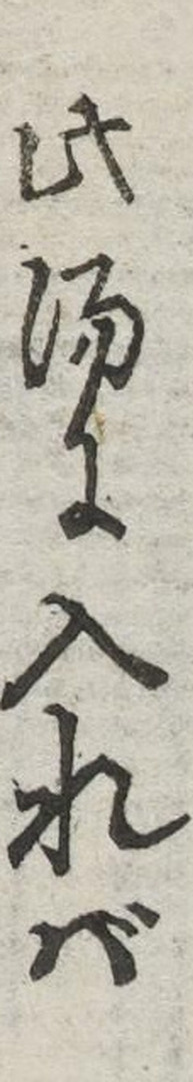此湯に入れば
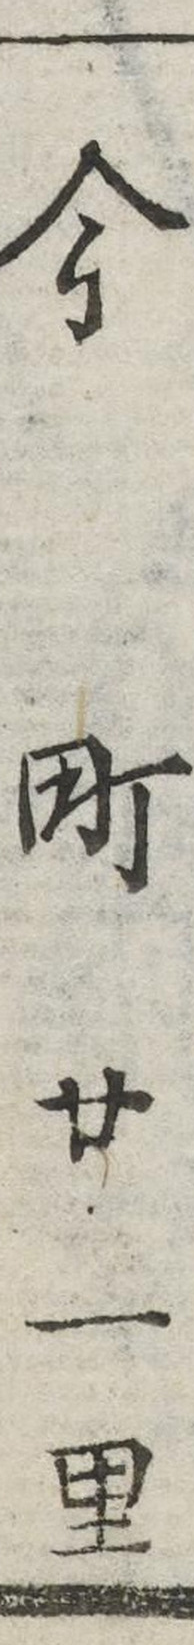今町廿一里
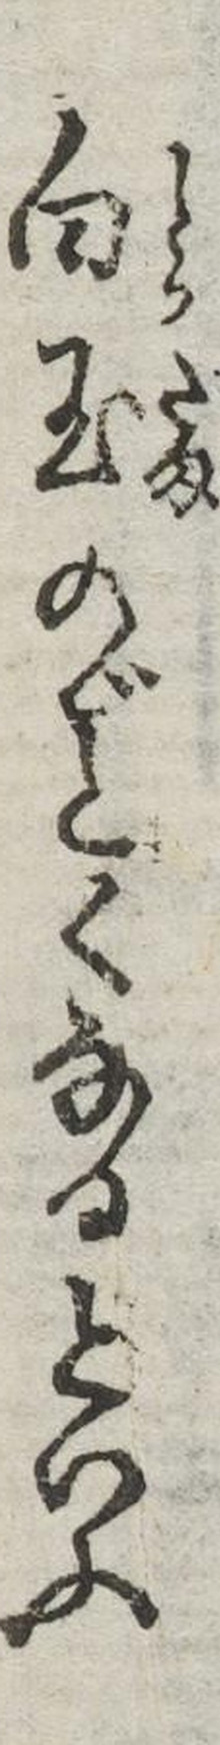白玉のごとくなるといふ
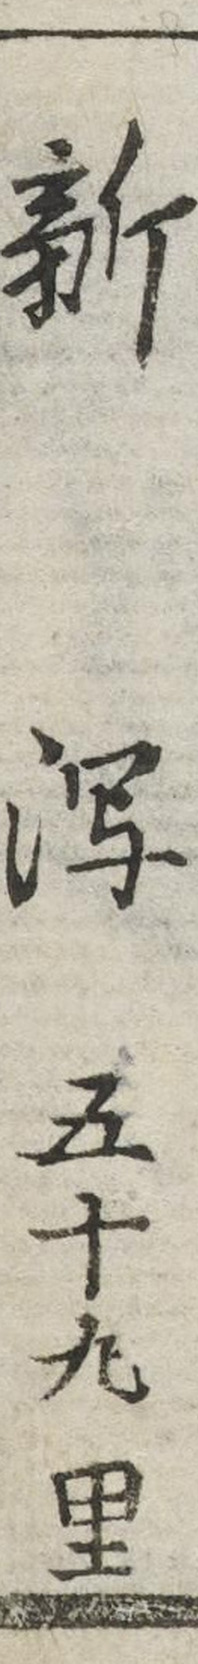新潟五十九里

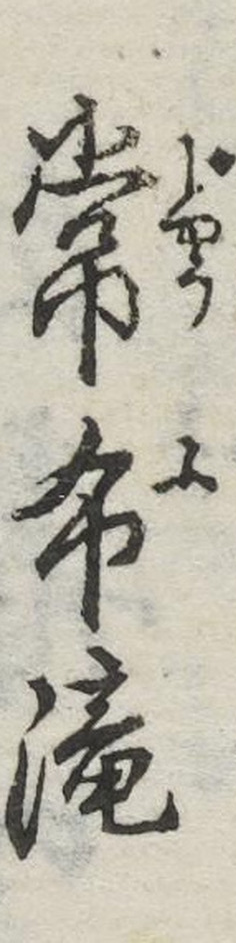常布滝
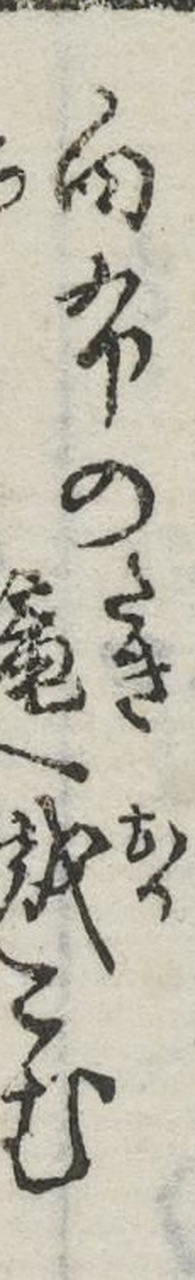白布の滝へ織こむ
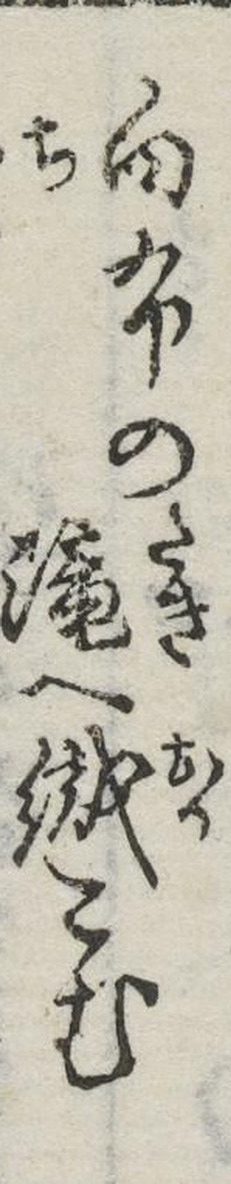白布の滝へ織こむ
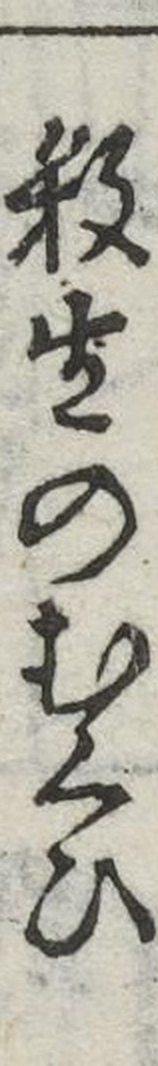殺生のむくひ
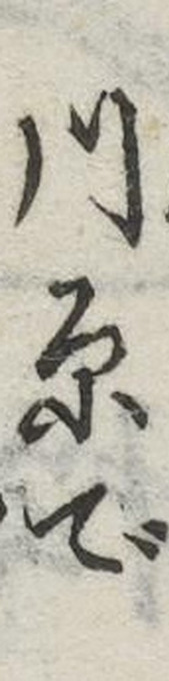川原で
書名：諸國温泉遊覽記　全
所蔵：東京大学地震研究所図書室 Earthquake Research Institute Library, The University of Tokyo, JAPAN
